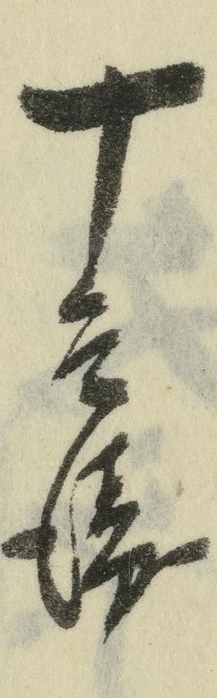十兵衛
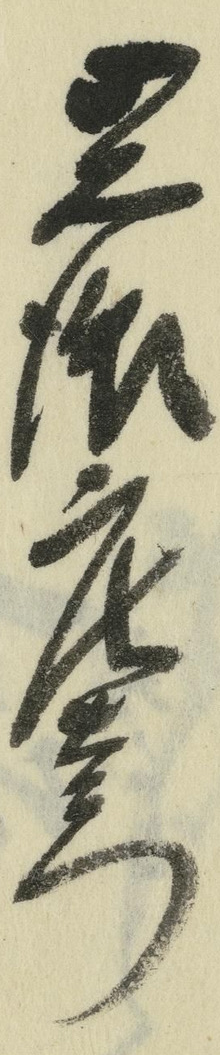岩瀬庄右衛門

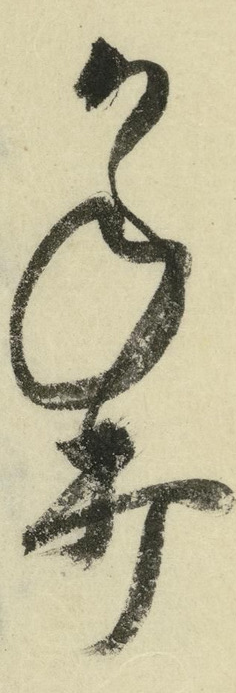かね打
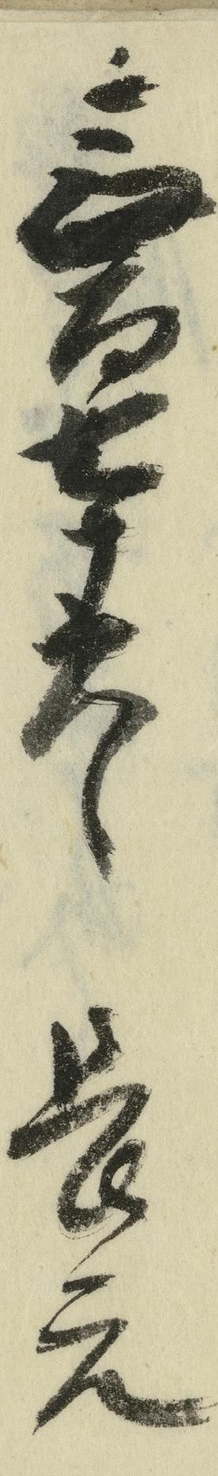一三百七十六文長元
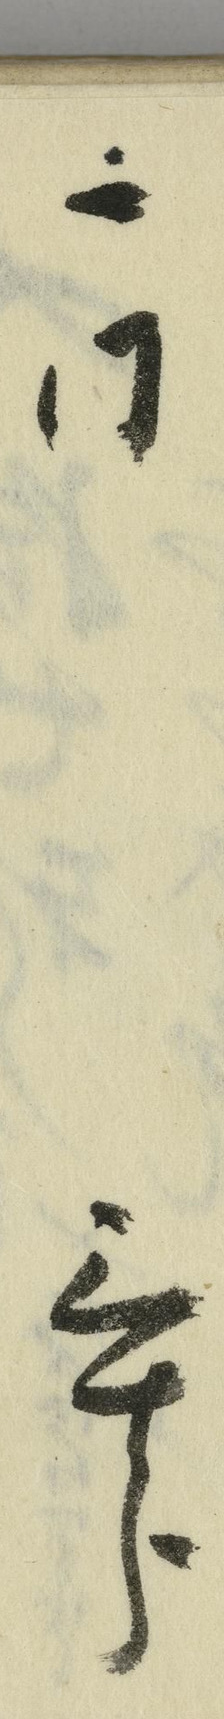一同三十郎
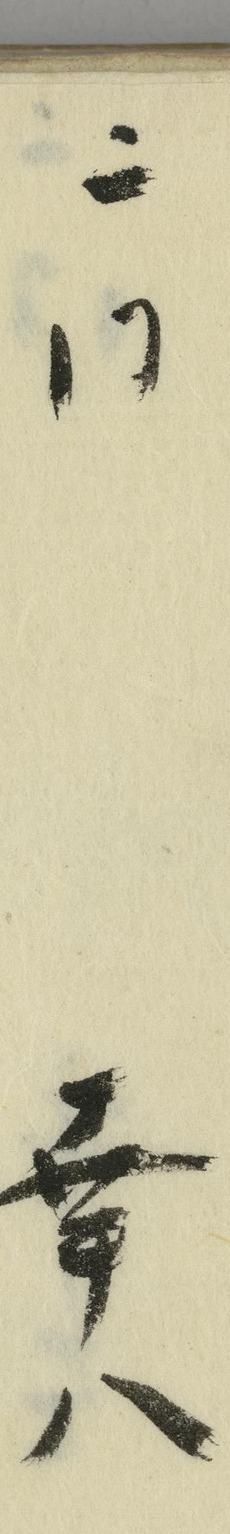一同幸八
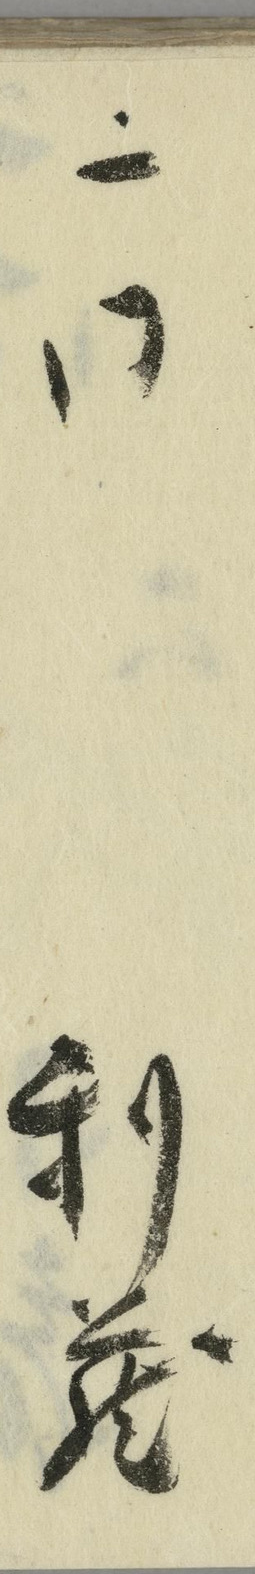一同利蔵
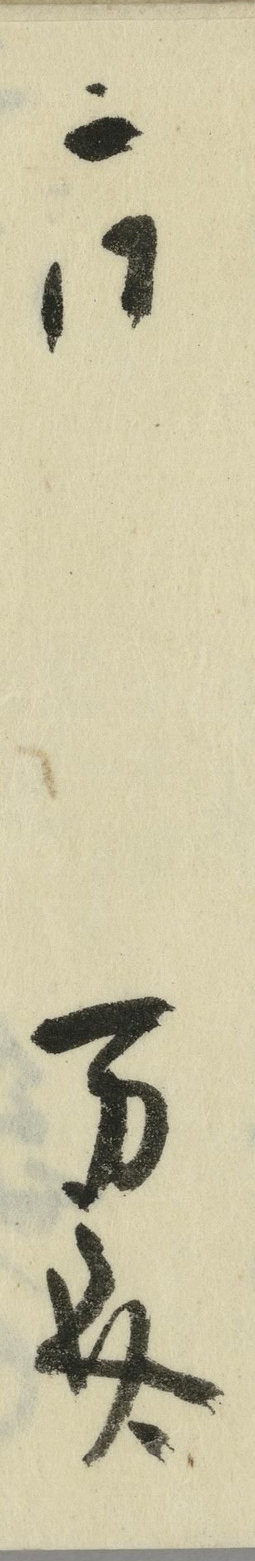一同万介
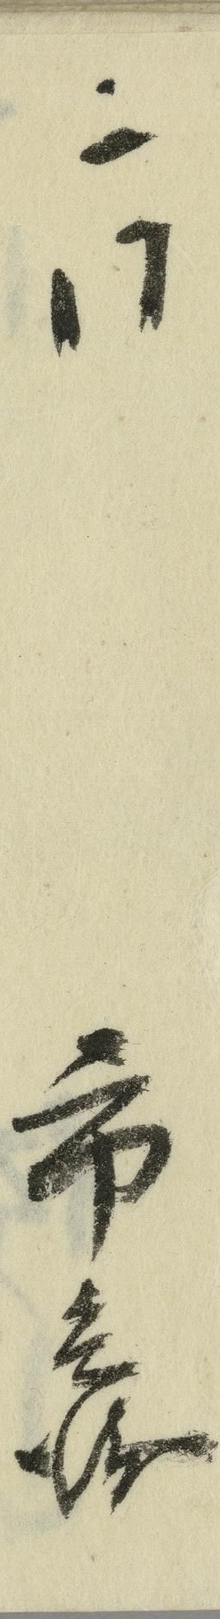一同市兵衛
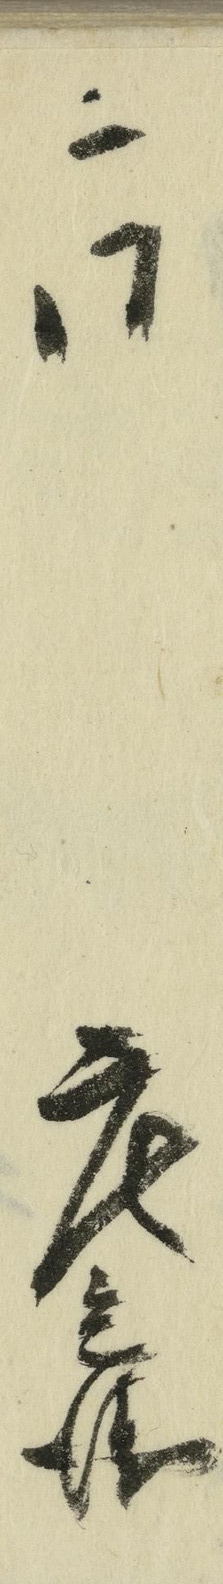一同庄兵衛
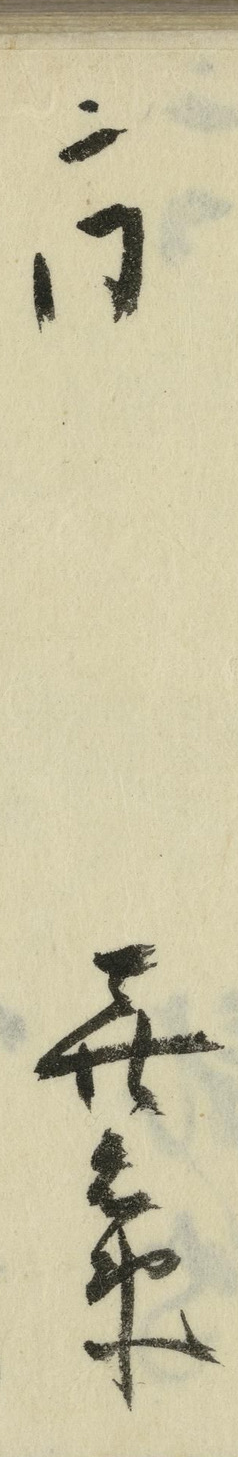一同喜兵衛

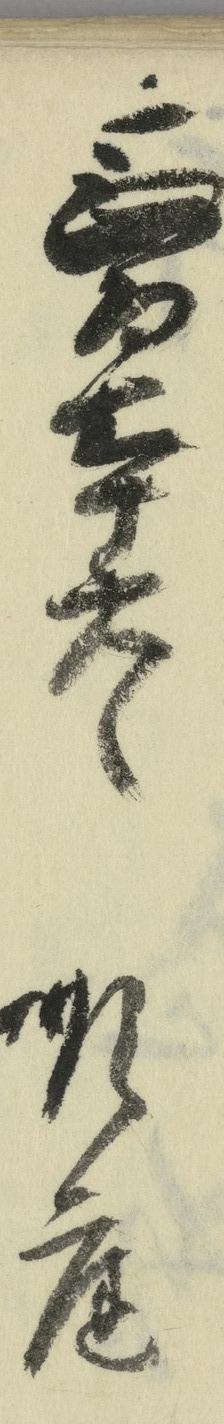一三百七十六文順庵
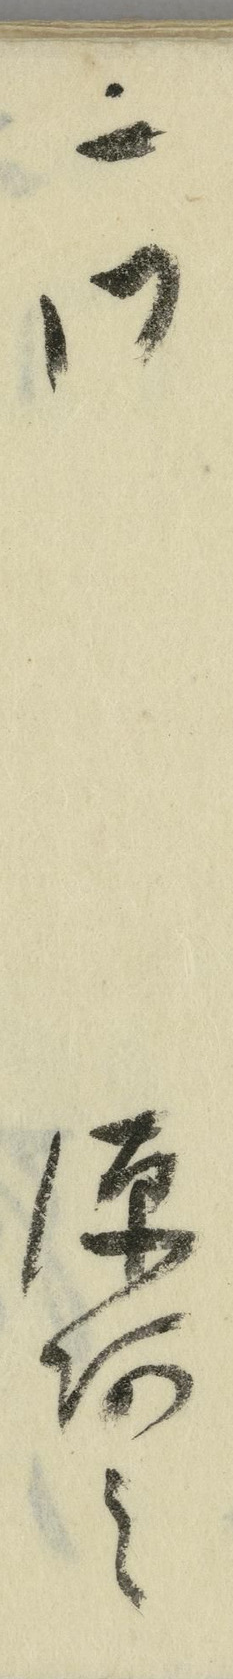一同源あみ
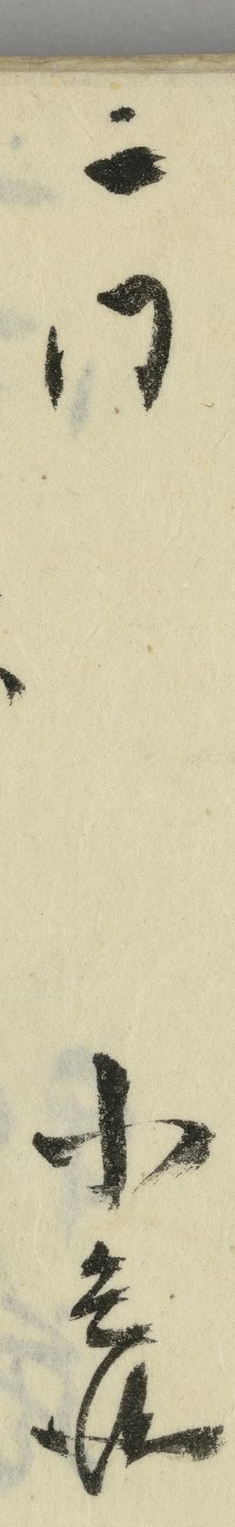一同小兵衛
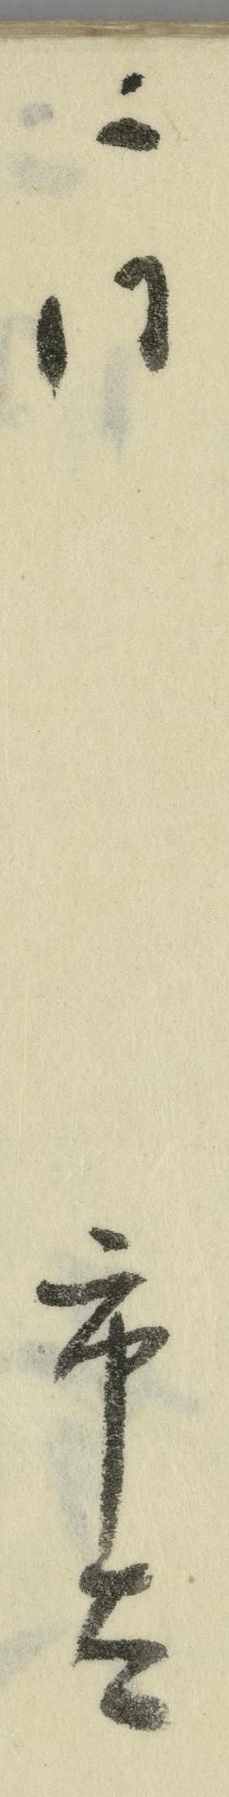一同市太
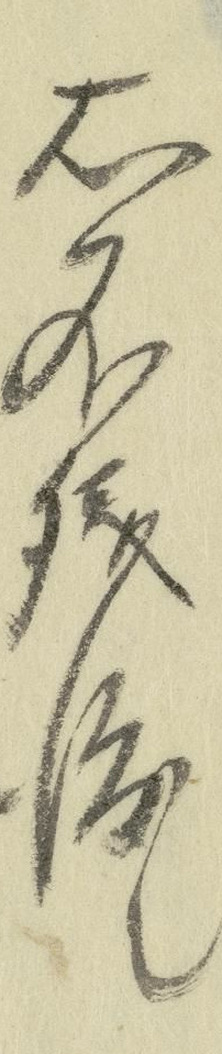右不残渡し
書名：天明淺間噴火ニ関スル書類
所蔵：東京大学地震研究所図書室 Earthquake Research Institute Library, The University of Tokyo, JAPAN
